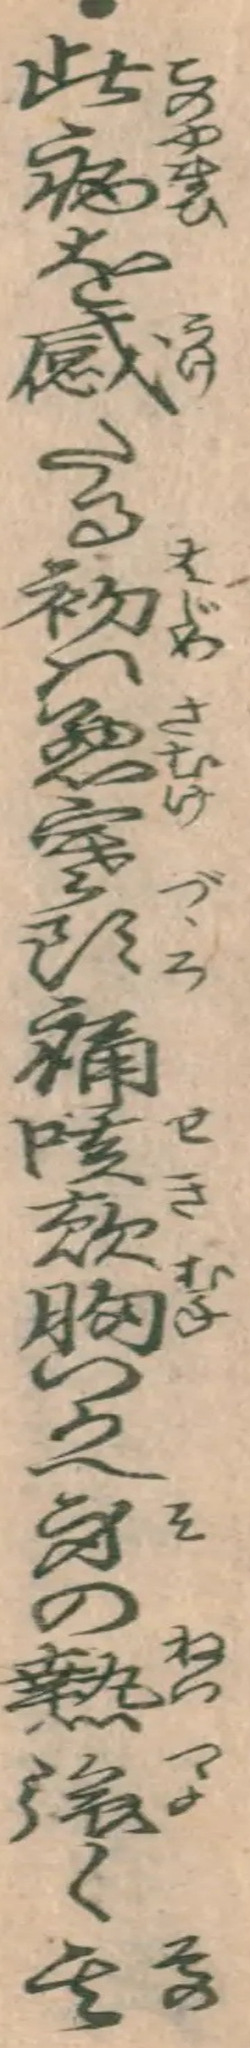・此病を感たる初は悪寒頭痛咳歎胸つかへ身の熱強く其
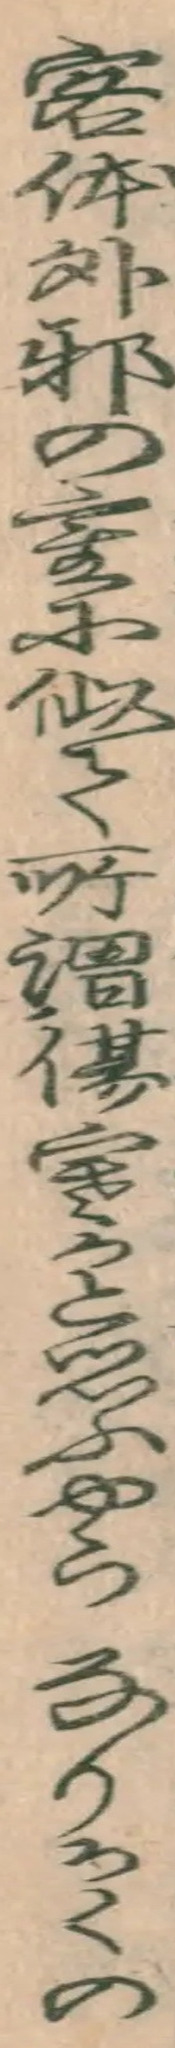容体外邪の重に似て所謂傷寒かと思ふやうなりかくの
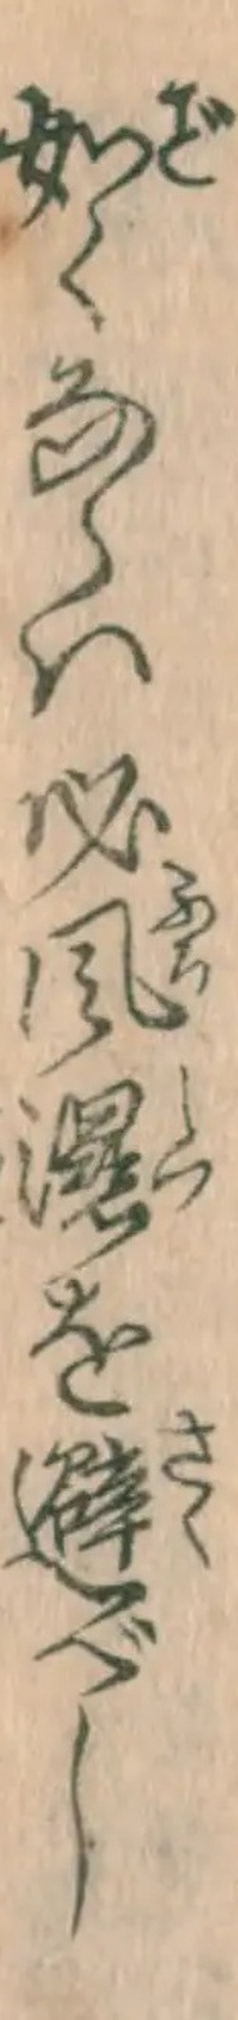如くならは必風湿を避べし
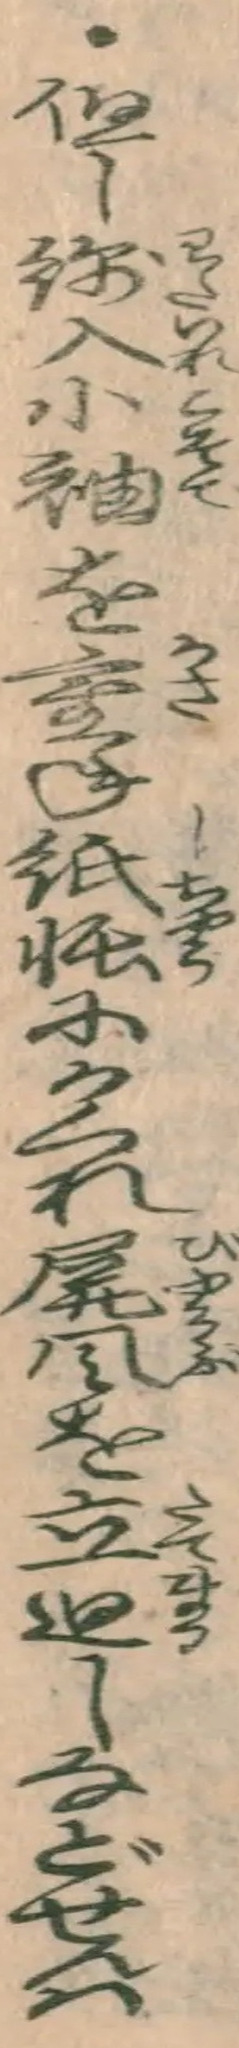・但し綿入小袖を重ね紙帳にかくれ屏風を立廻しなどせんは
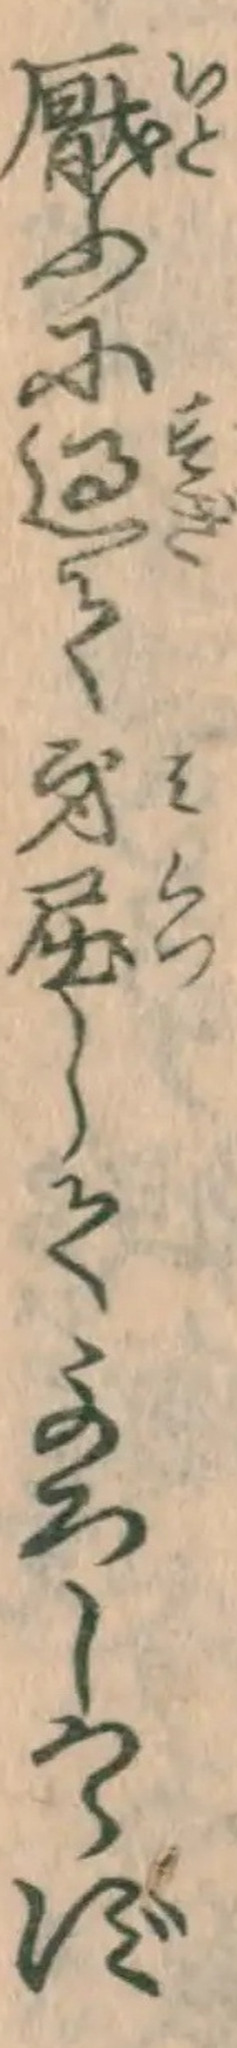厭ふに過て身屈してよろしからず
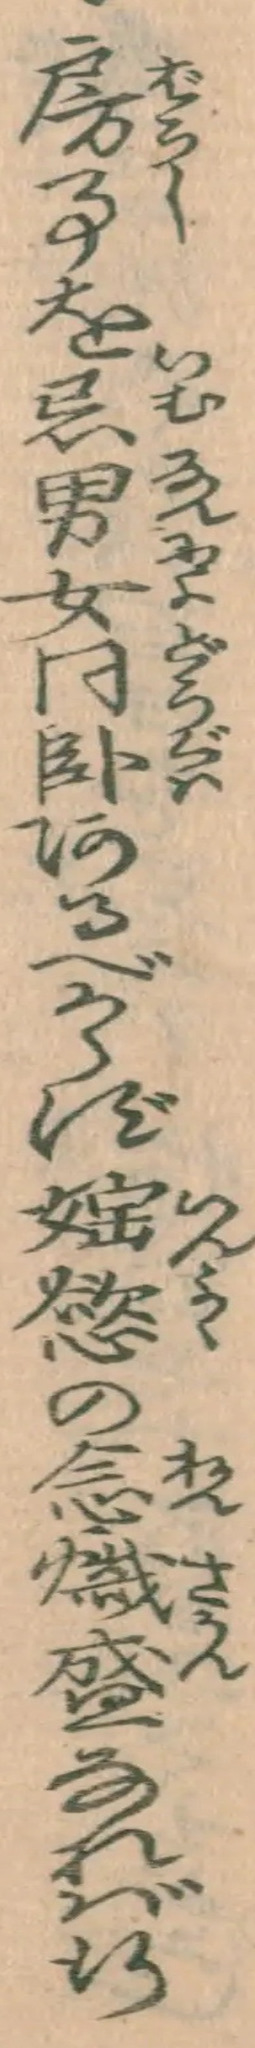・房事を忌男女同臥あるべからず婬慾の念熾盛なれば行
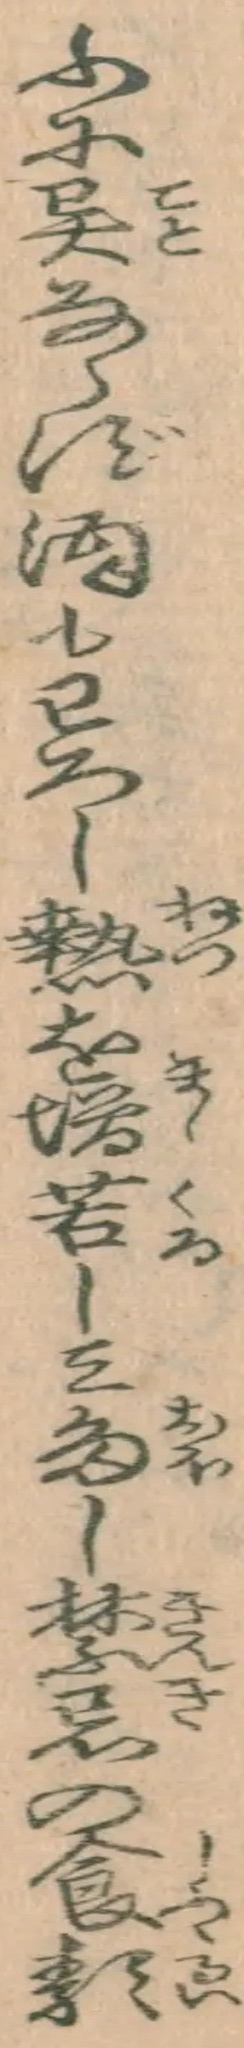ふに異ならず酒もわろし熱を増苦しみ多し禁忌の食類
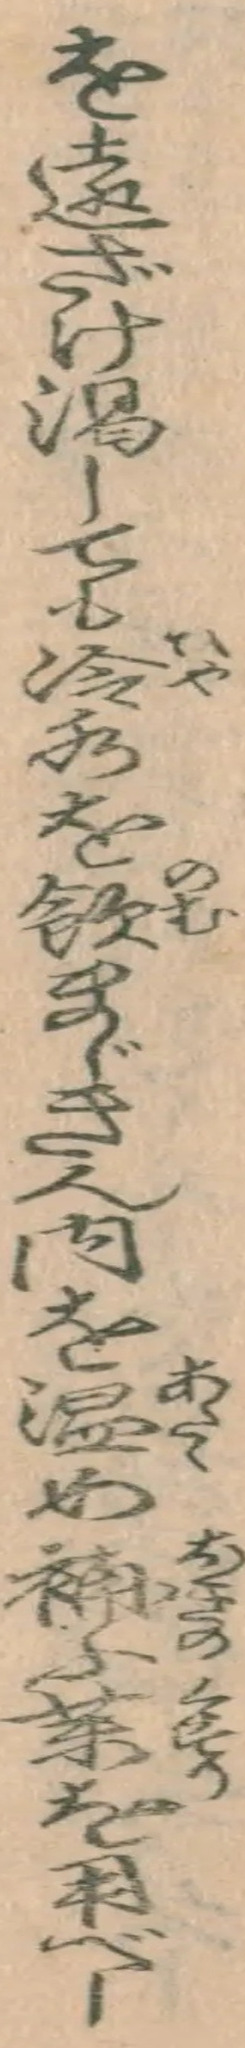を遠ざけ渇しても冷水を飲まじき也内を温め補ふ薬を用べし
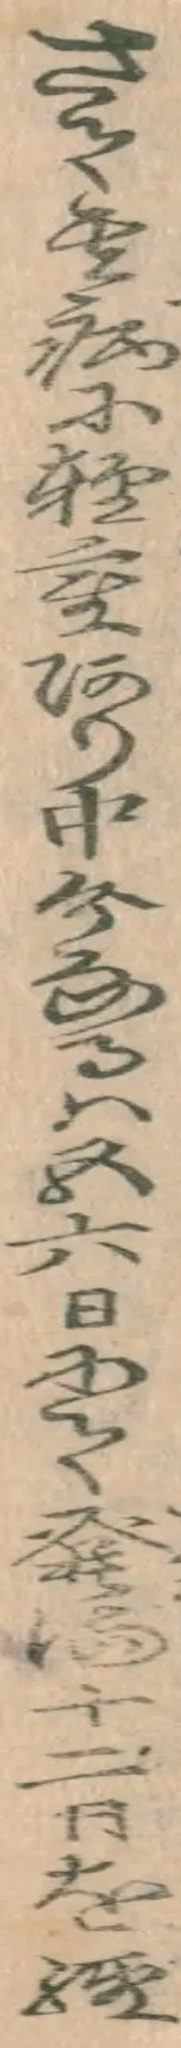さて其病に軽重あり中分なるは五六日にて発病十二日を経
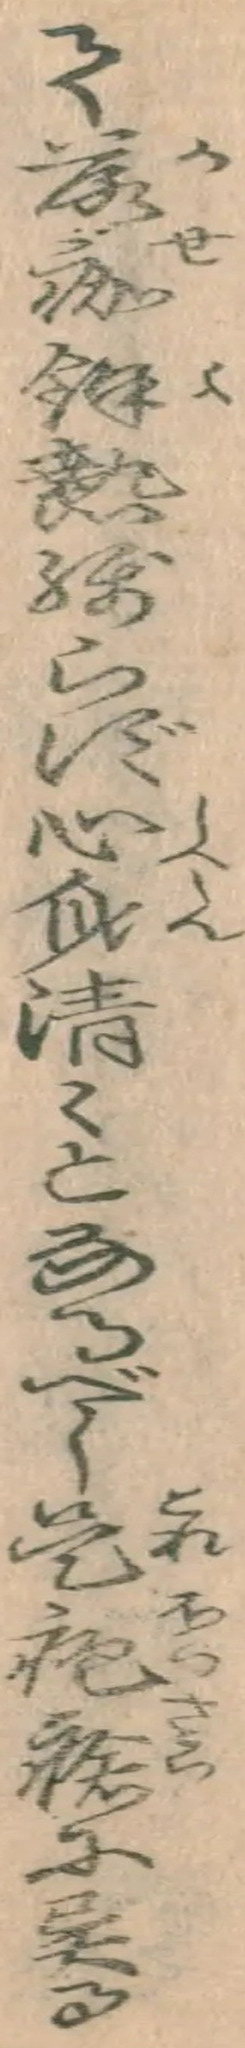て落痂余熱残らず心身清くとなるべし是疱瘡に異る
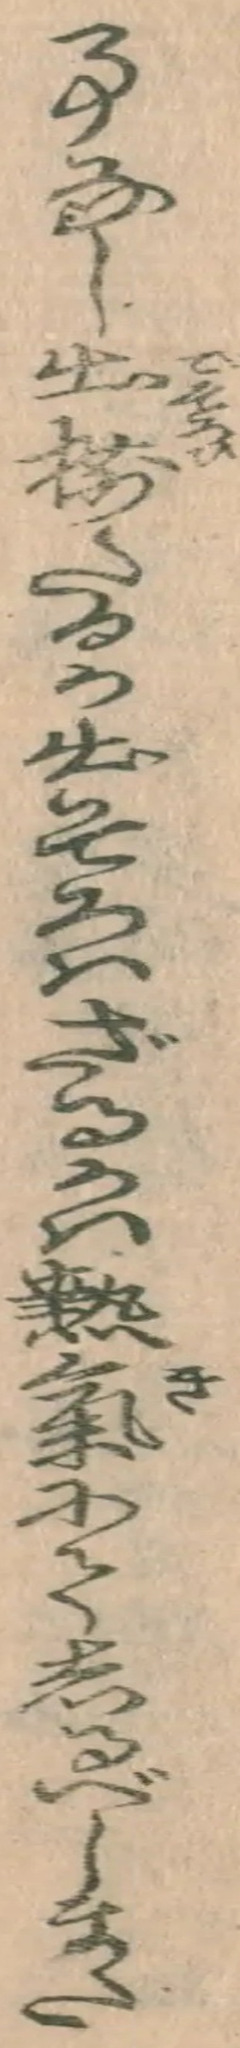事なし出揃たるか出そろはざるかは熱気にてしるべしまた
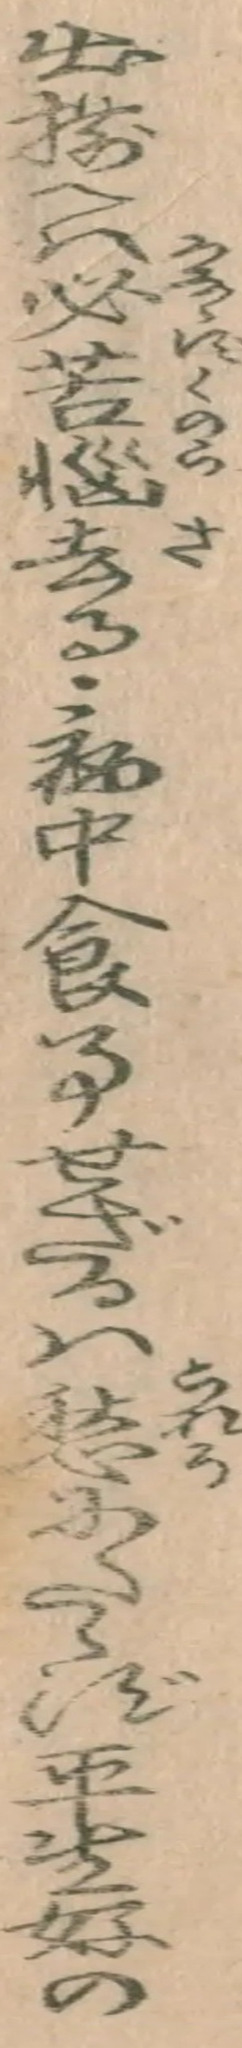出揃へは必苦悩去る・病中食事せざるは愁にたらず平生好の
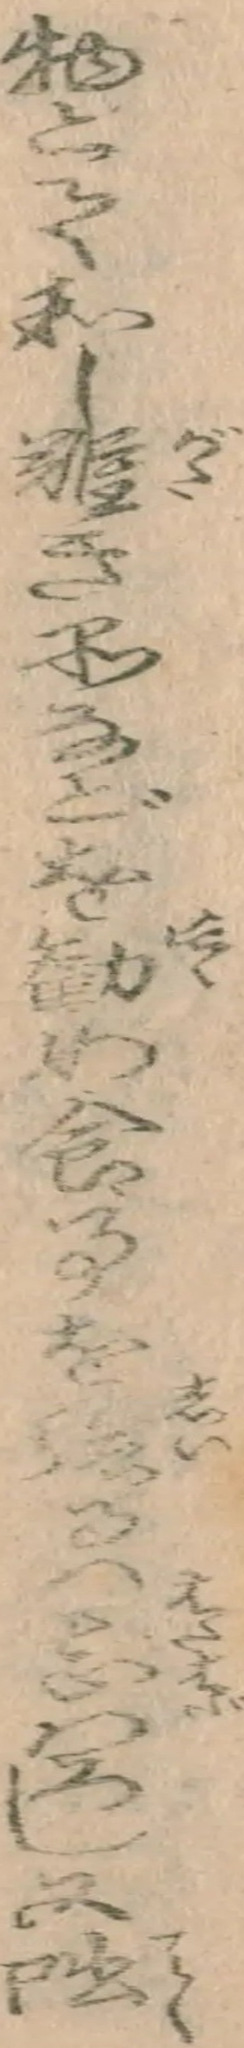物とて和し難き品などを勧め食事を強るは甚はろし又吐

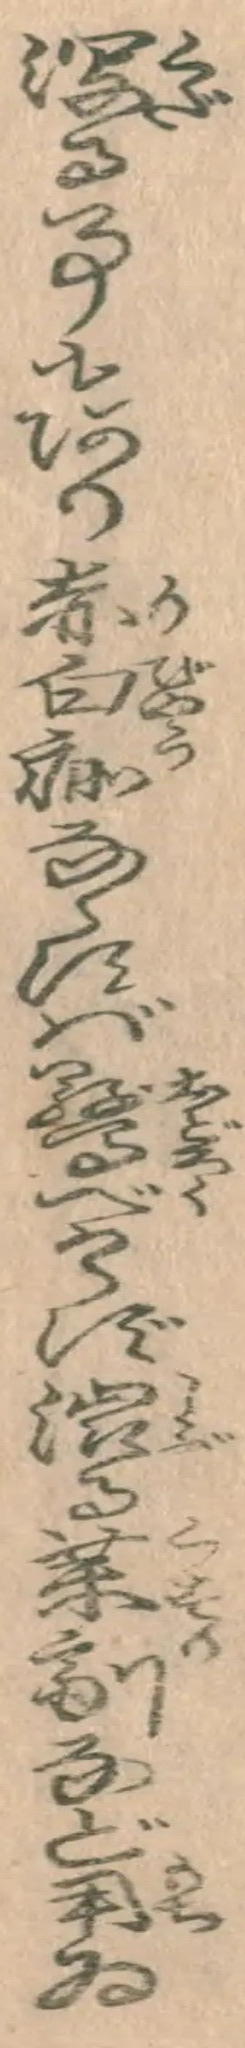瀉る事もあり赤白痂ならすば驚べからず渋る薬剤など用ゐ
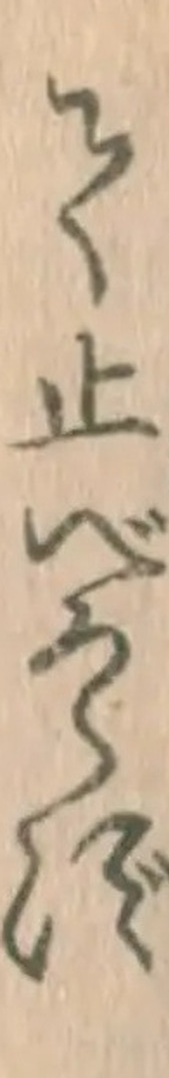て止べからず
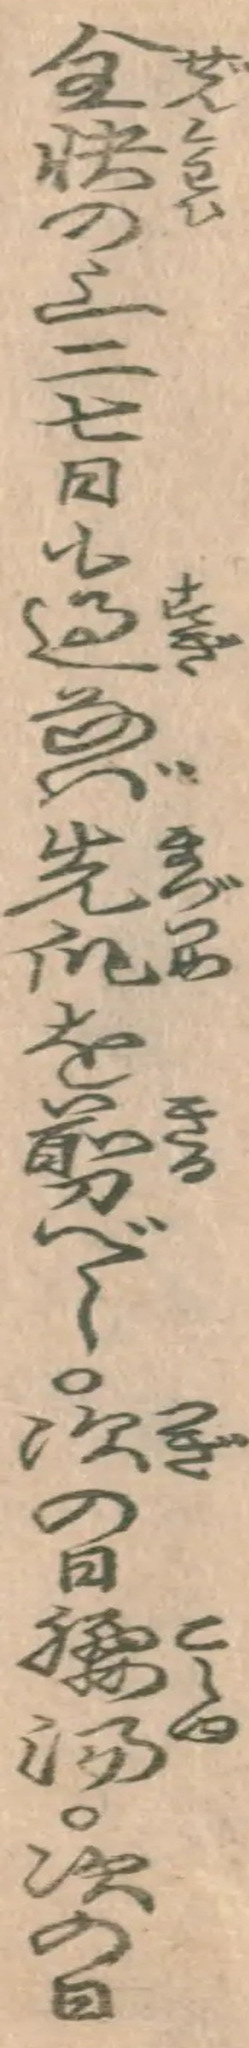全快の上二七日も過なば先爪を剪べし○次の日腰湯○次の日
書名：麻疹養生鑑
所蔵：国立国会図書館 National Diet Library, JAPAN
